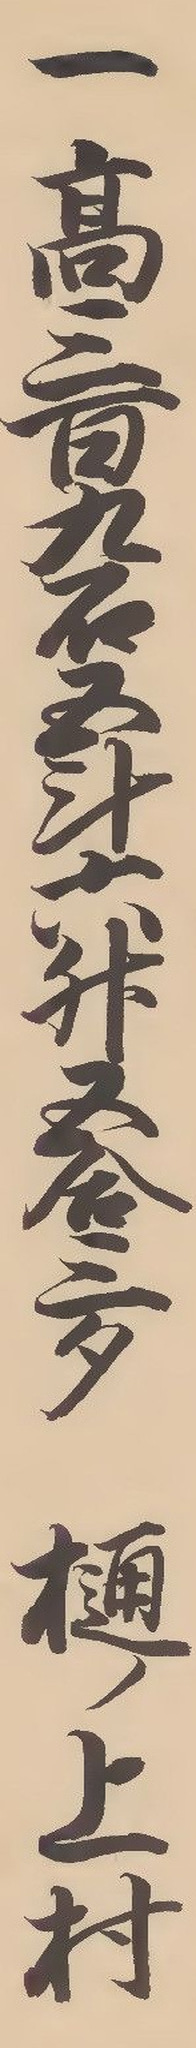一高三百九石五斗六升五合三勺樋ノ上村

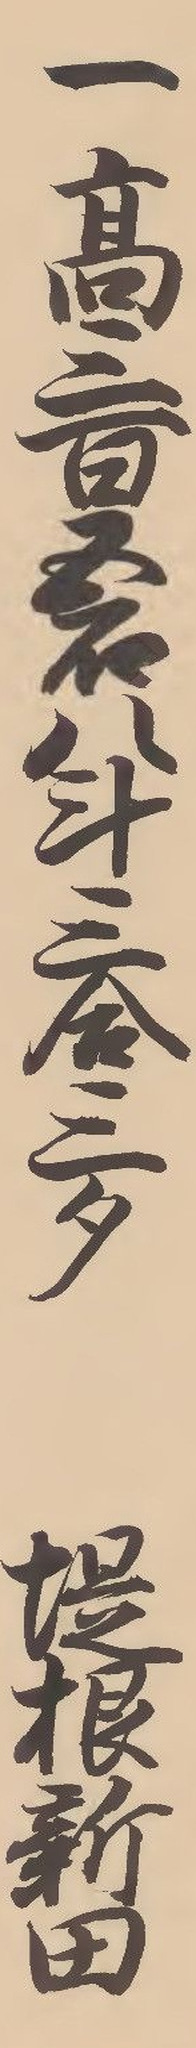一高三百五石八斗三合三勺堤根新田
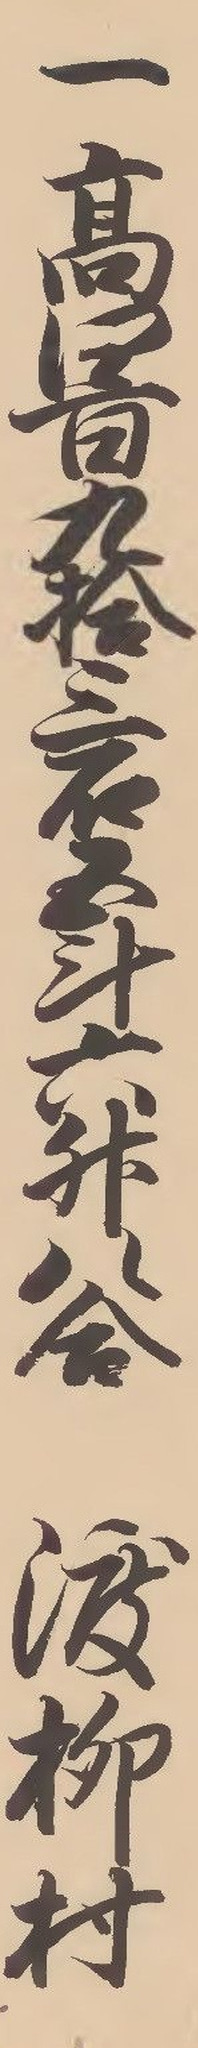一高四百九拾三石五斗六升八合渡柳村
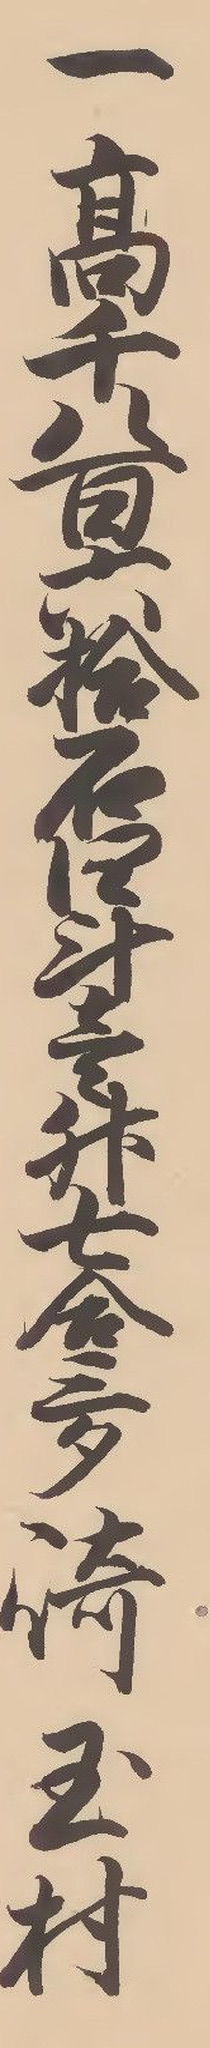一高千八百六拾石四斗壱升七合三勺埼玉村
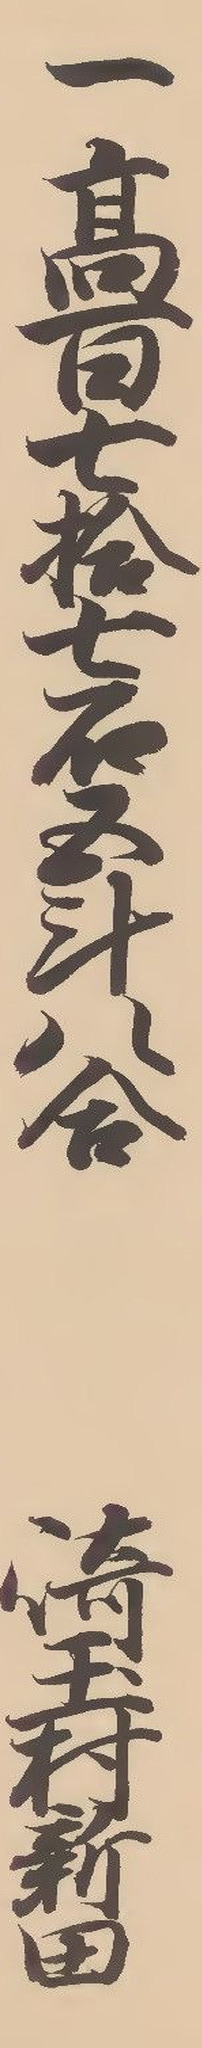一高百七拾七石五斗八合埼玉村新田
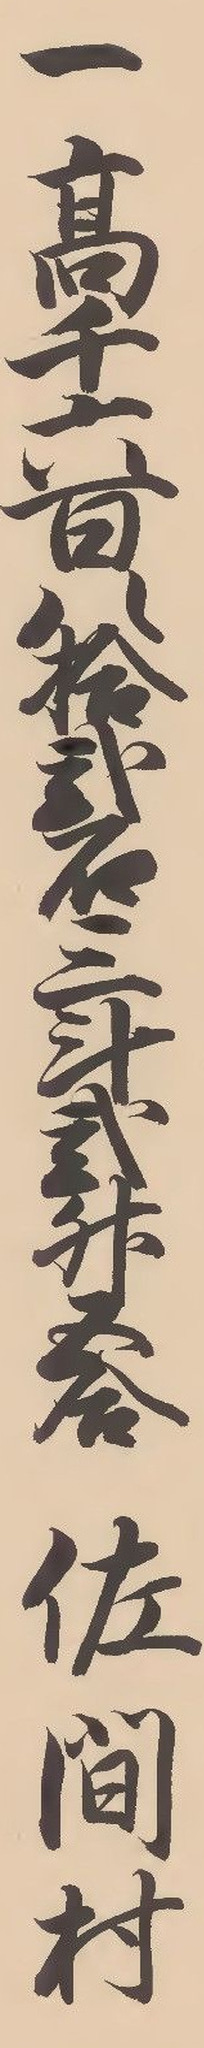一高千六百八拾弐石三斗弐升五合佐間村
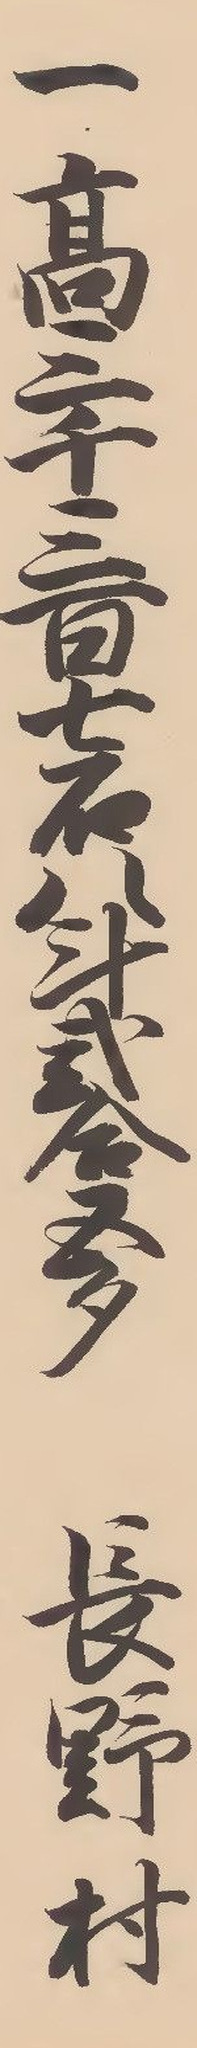一高三千三百七石八斗弐合五勺長野村
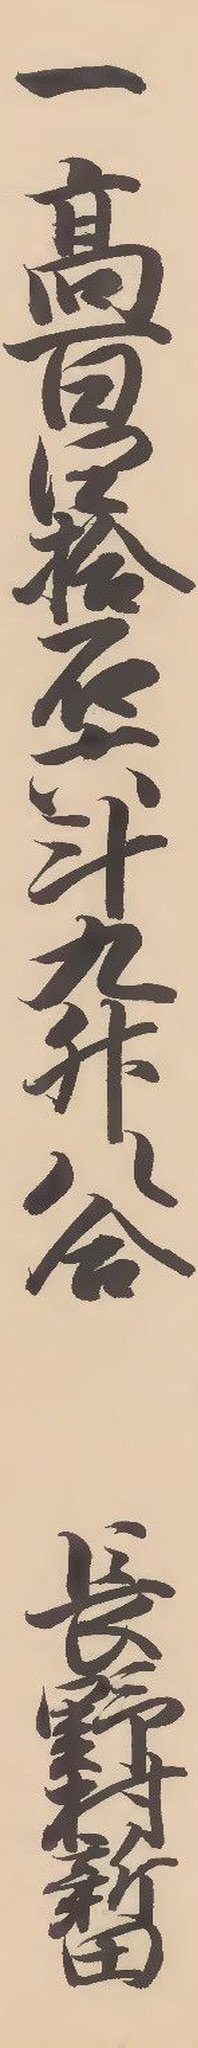一高百四拾石六斗九升八合長野村新田
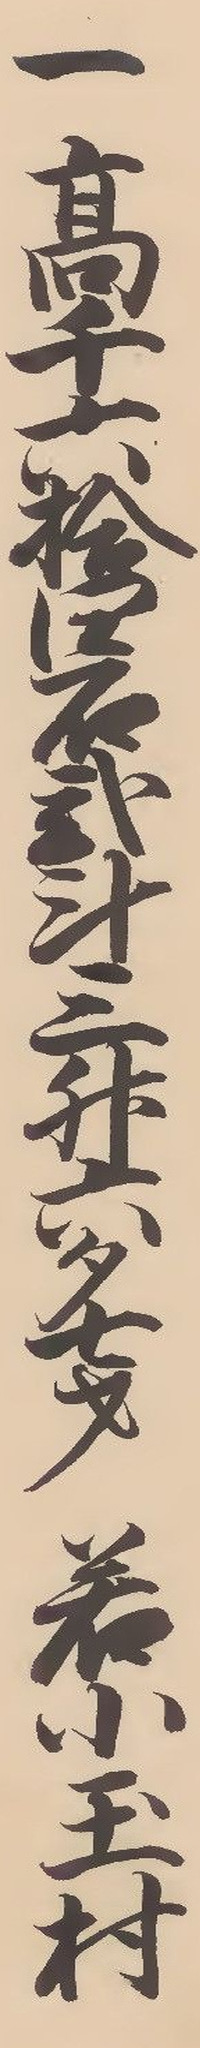一高千六拾四石弐斗三升六勺七才若小玉村

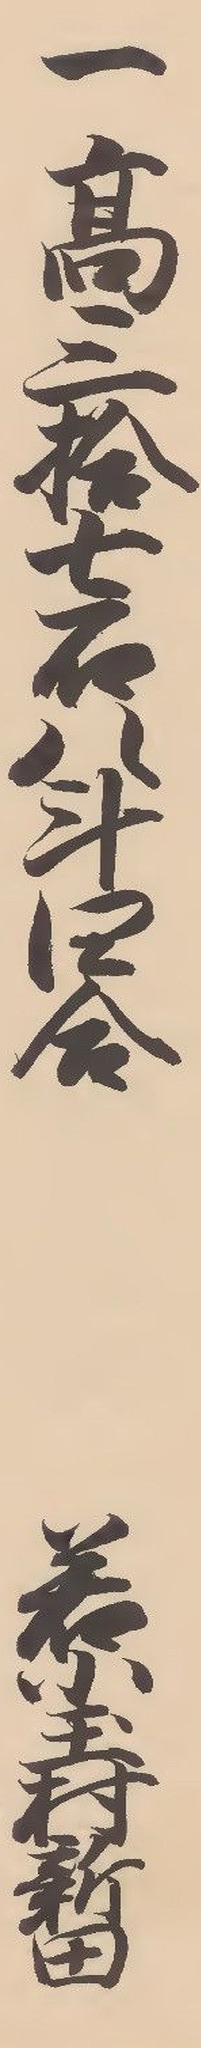一高三拾七石八斗四合若小玉村新田
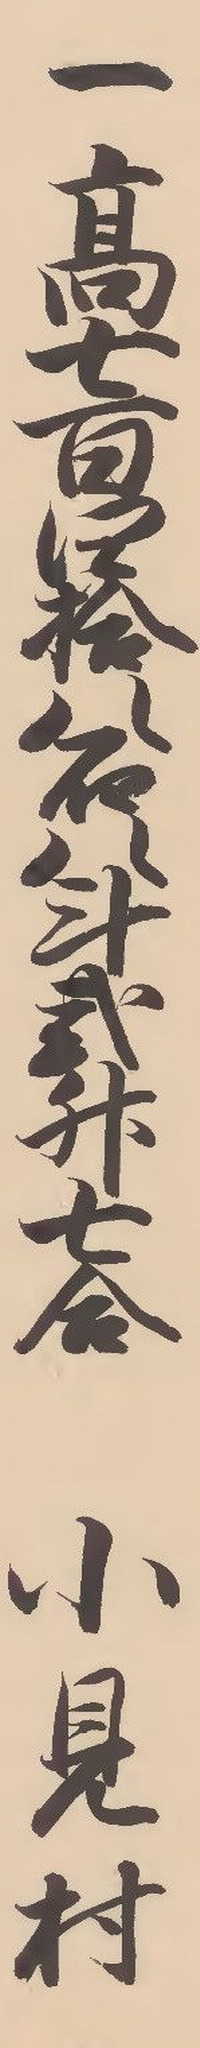一高七百四拾八石八斗弐升七合小見村
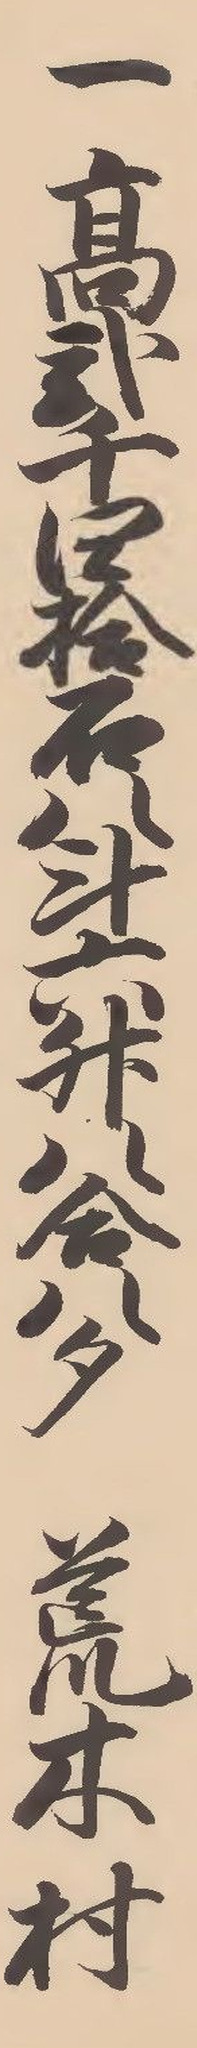一高弐千四拾石八斗六升八合八勺荒木村
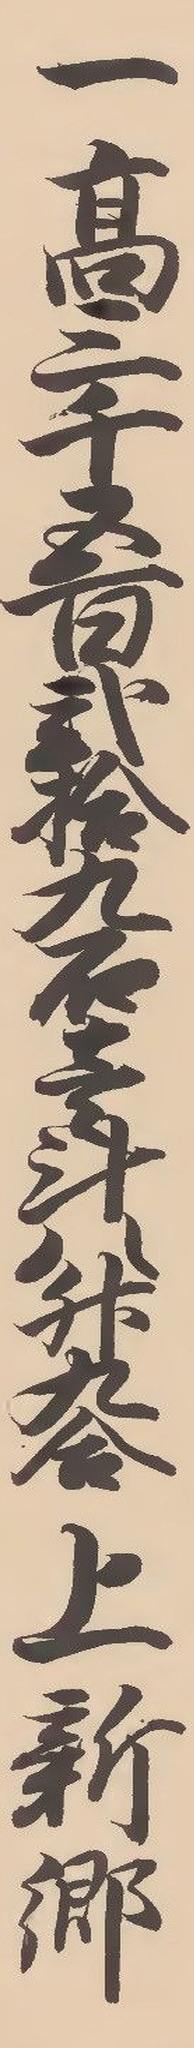一高三千五百弐拾九石壱斗八升九合上新郷
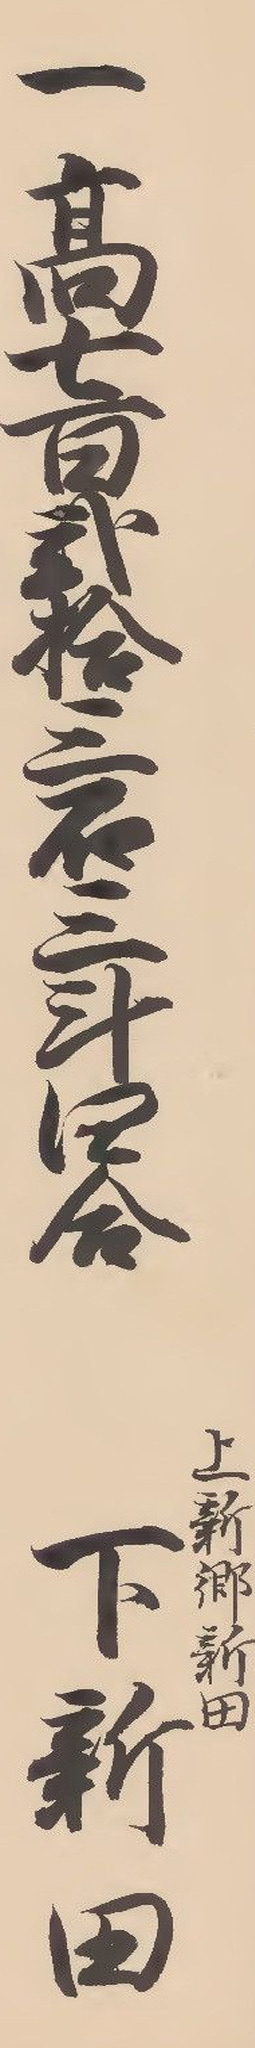一高七百弐拾三石三斗四合下新田
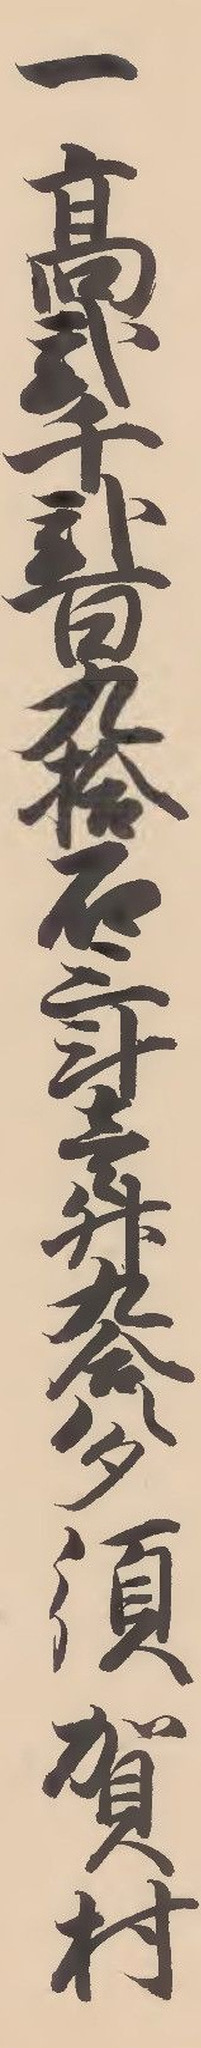一高弐千弐百九拾石三斗壱升九合八勺須賀村
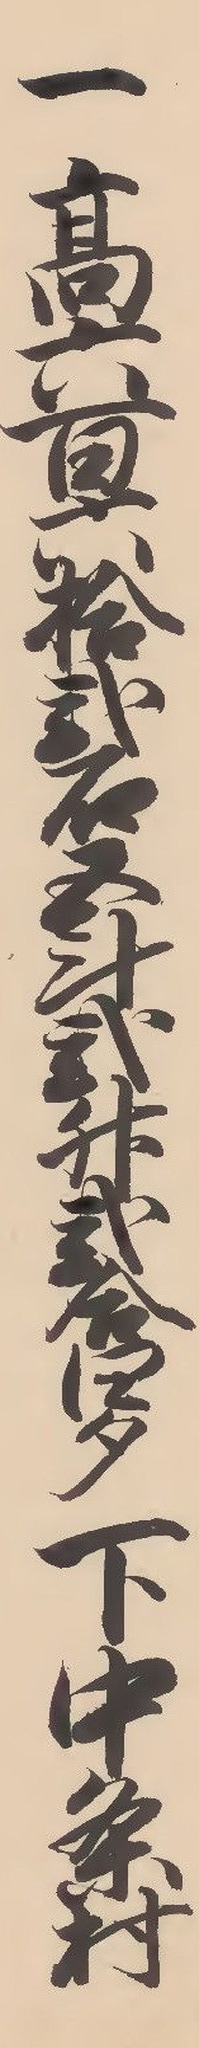一高六百六拾弐石五斗弐升弐合四勺下中条村
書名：武蔵国郷帳　下
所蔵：国立公文書館 National Archives of Japan
